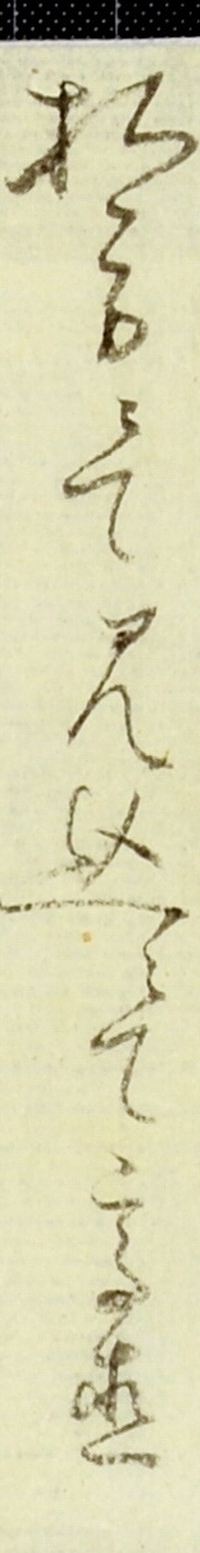払方にて見込にて高直
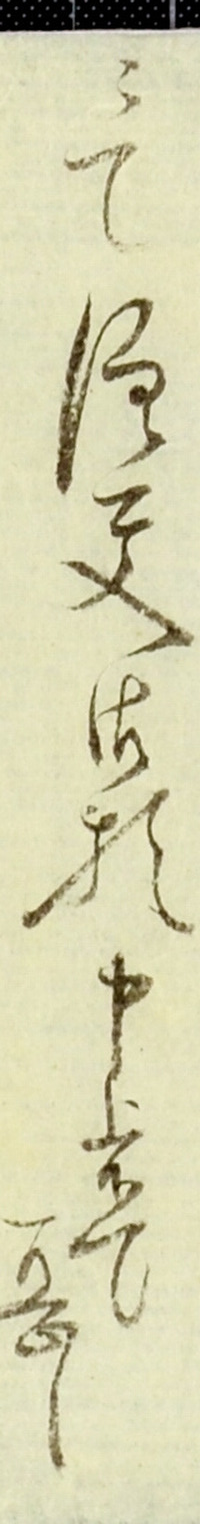にて注文御頼申上候はゝ
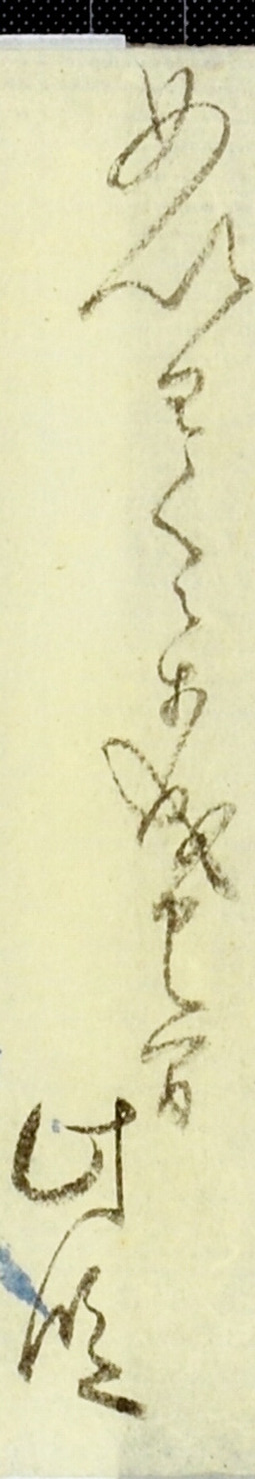めいわくに相成申候間
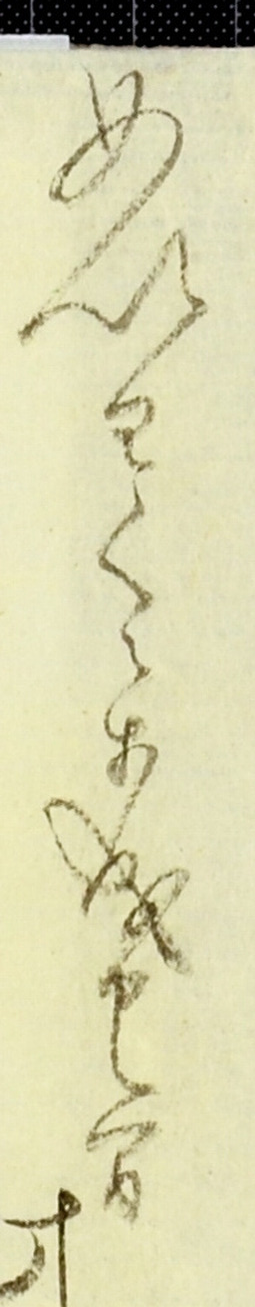めいわくに相成申候間
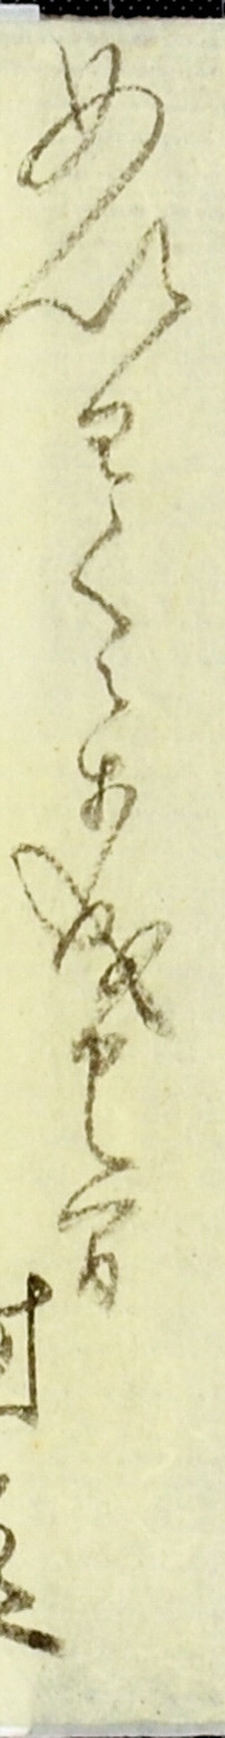めいわくに相成申候間
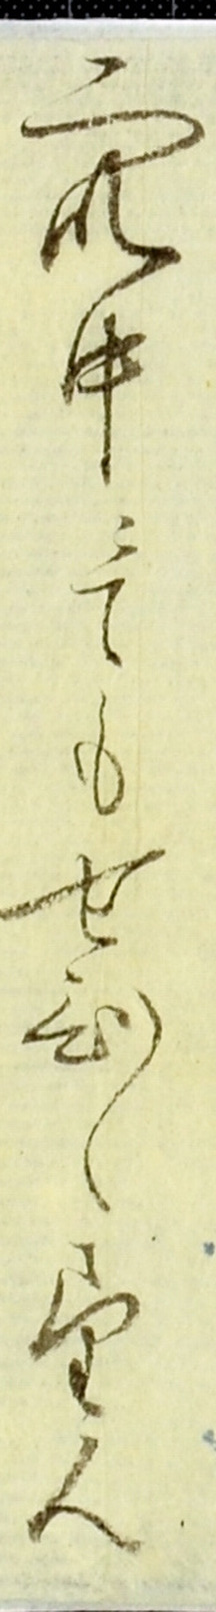衆中にてもせひ〳〵望人
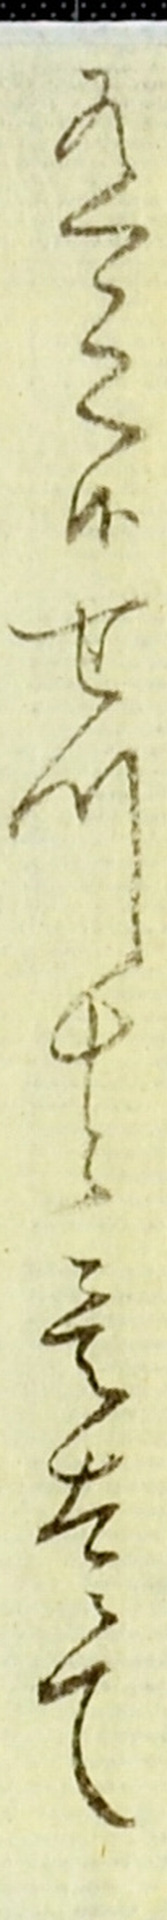有之候せつは壱太にて
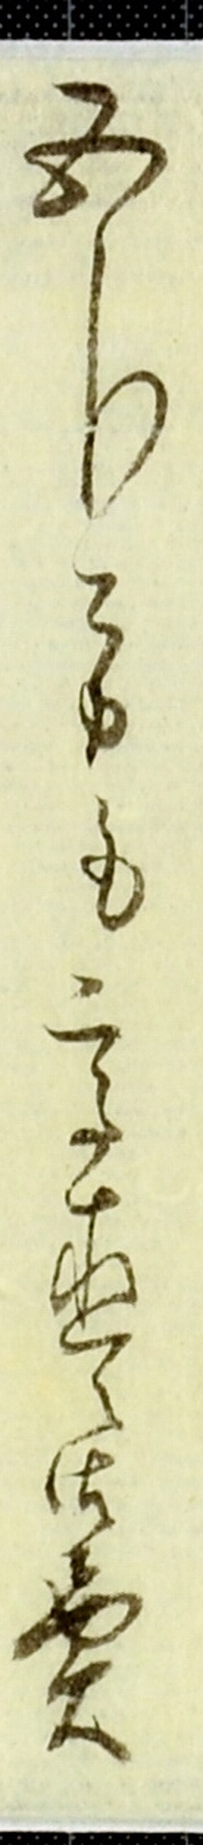五分方も高直に御売
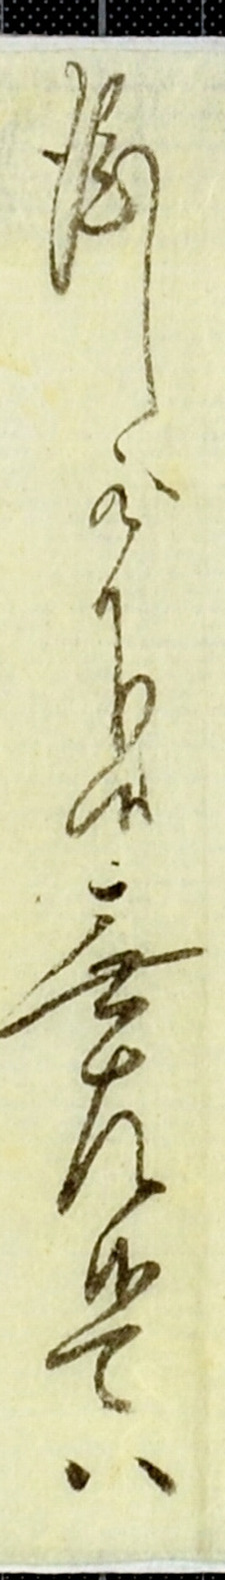渡し可被下候無左候ては
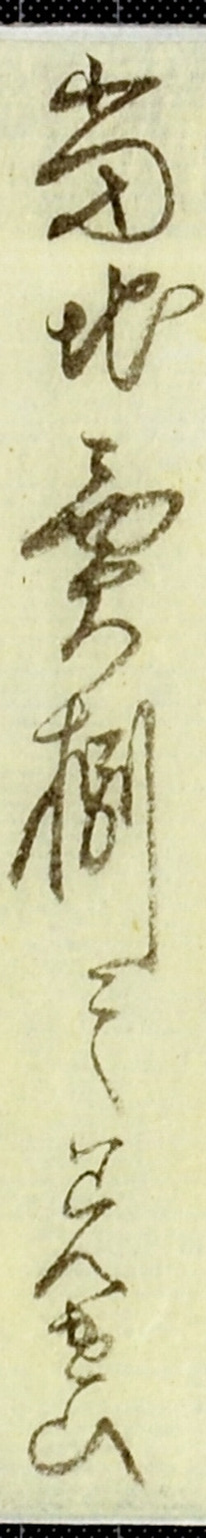当地売捌之差遣ひ
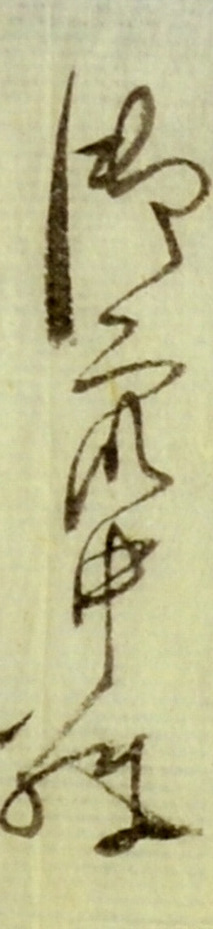御衆中様

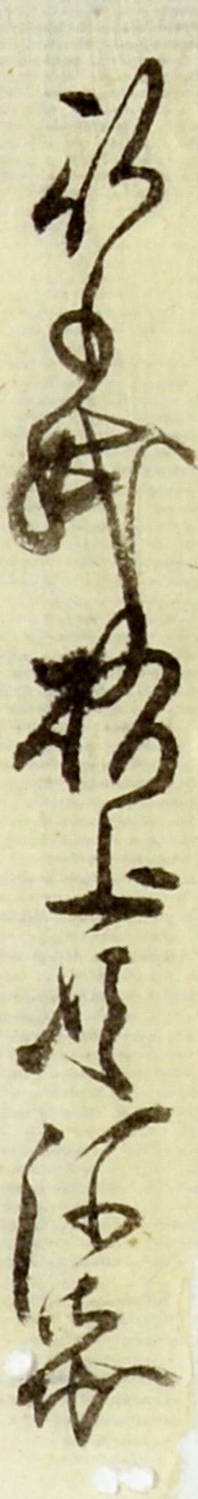以手紙啓上仕候弥御地
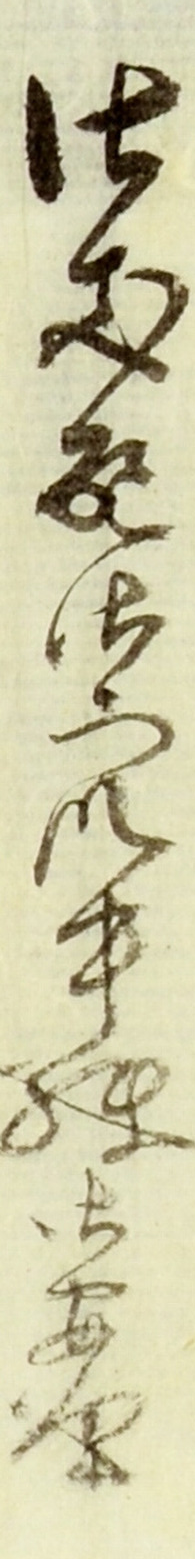御支配御衆中様御安康
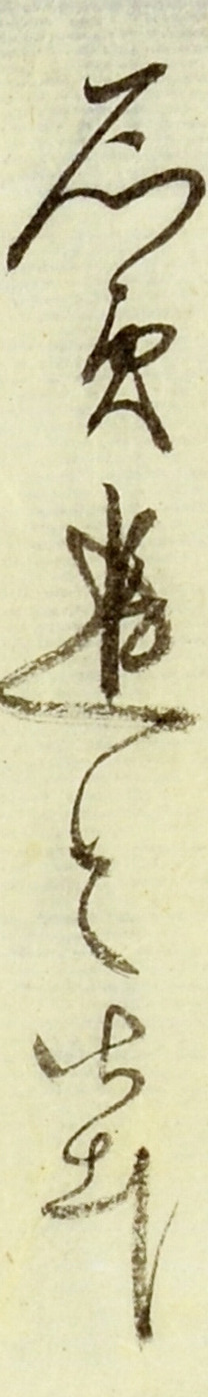石灰追々御出し
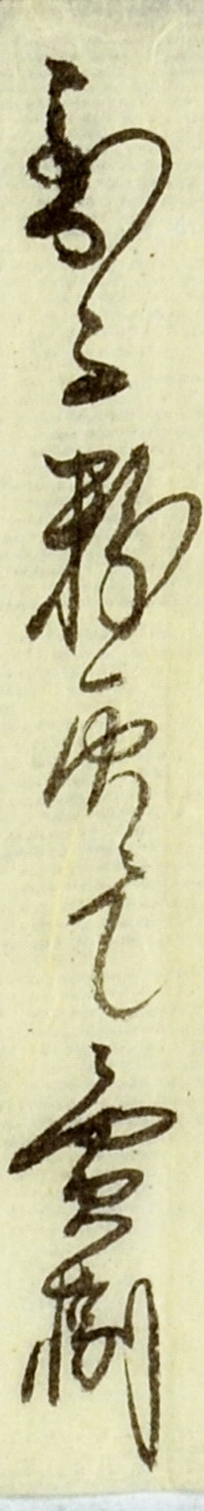到て粉灰にて売捌
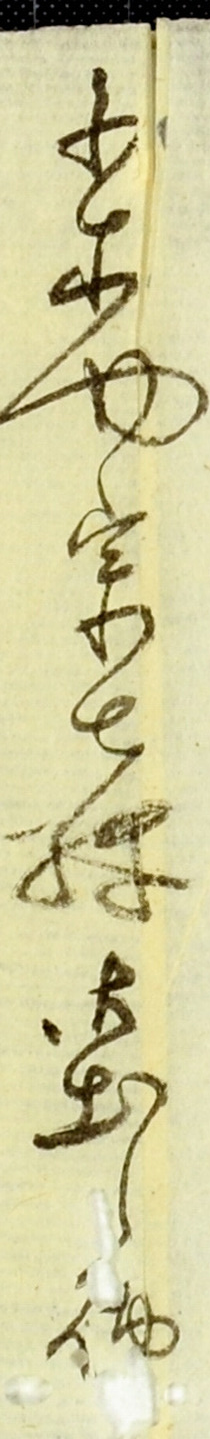小木や宗七様御出之砌
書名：書状
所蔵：伊那市立高遠町図書館・合同会社AMANE
